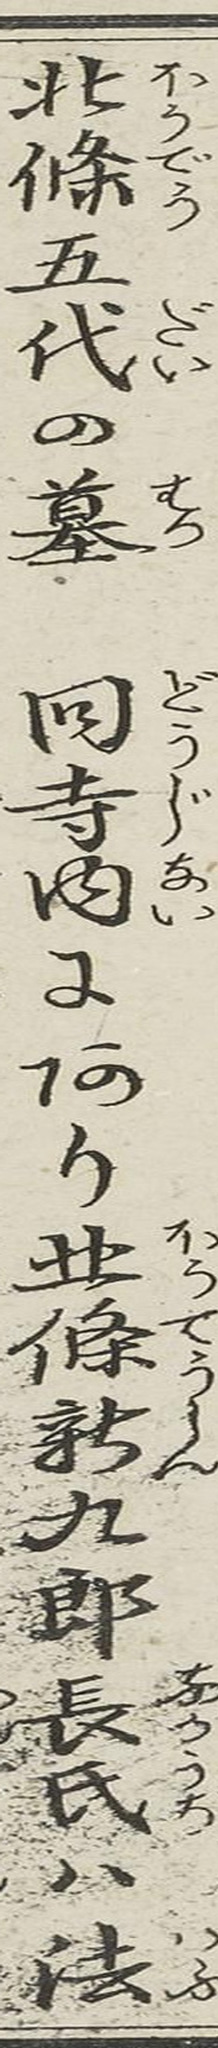北條五代の墓同寺内にあり北條新九郎長氏は法
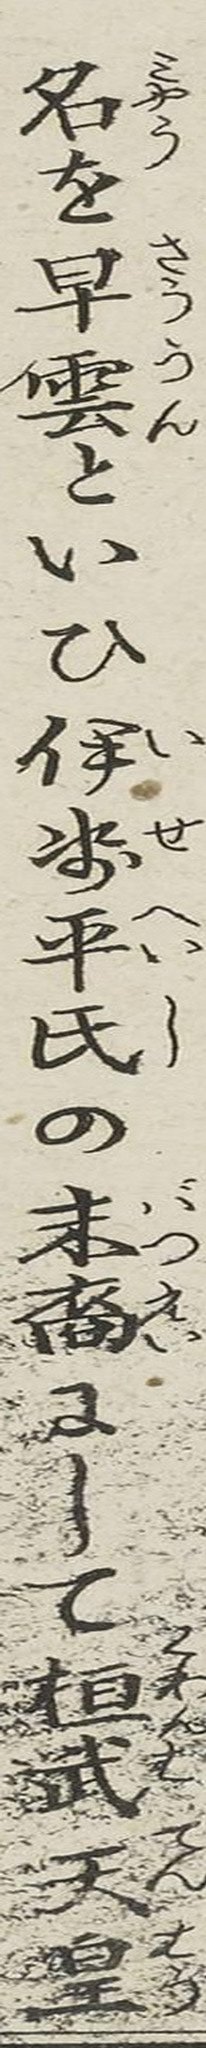名を早雲といひ伊勢平氏の末裔にして桓武天皇
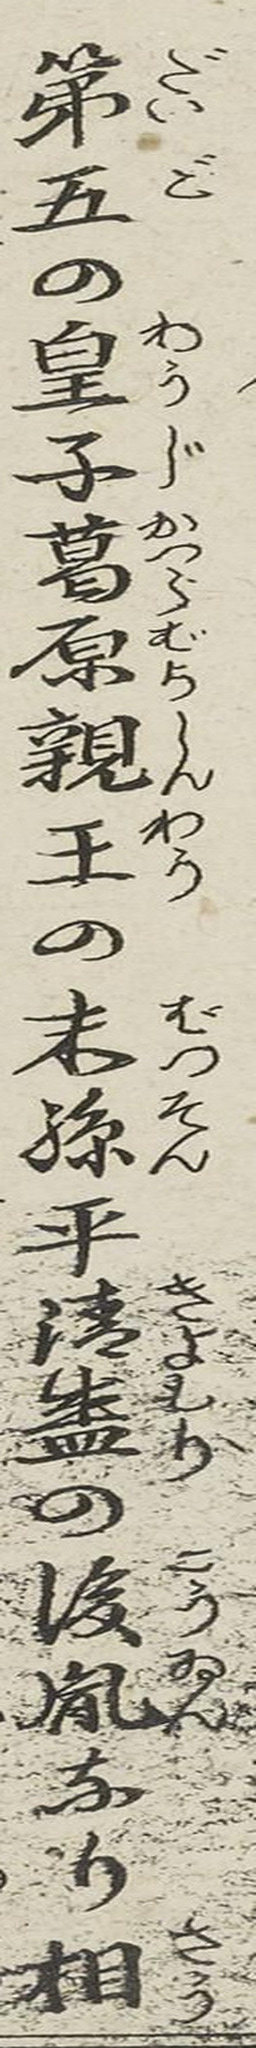第五の皇子葛原親王の末孫平清盛の後胤なり相
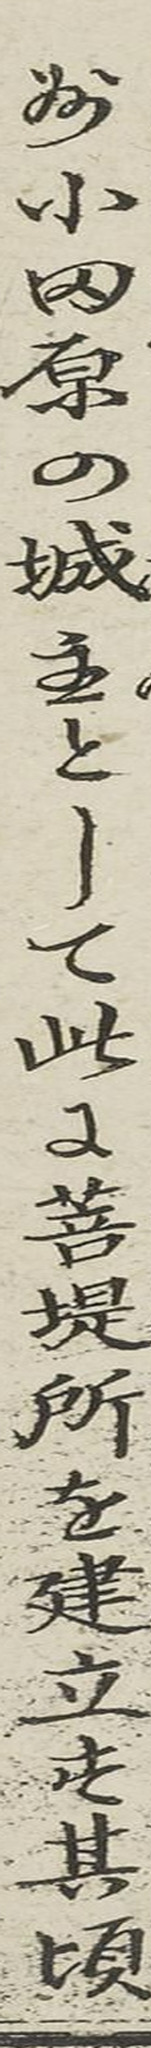州小田原の城主として此に菩提所を建立す其頃

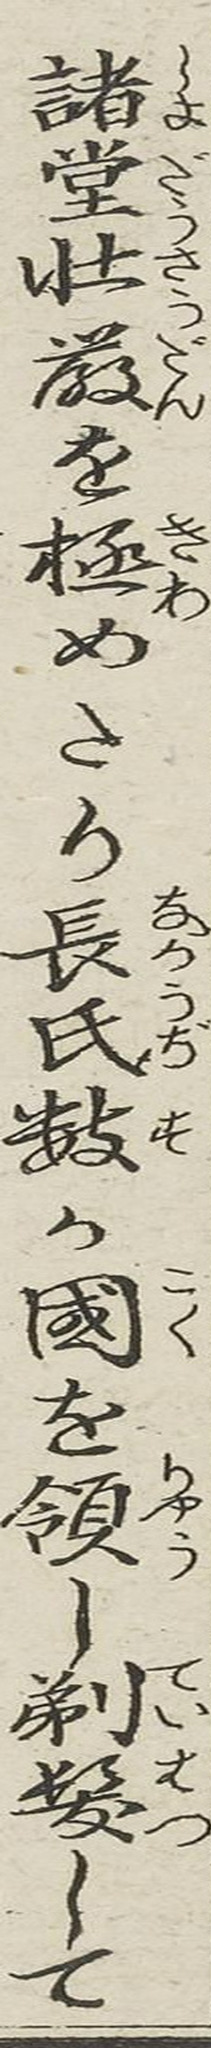諸堂壮厳を極めたり長氏数か國を領し剃髪して
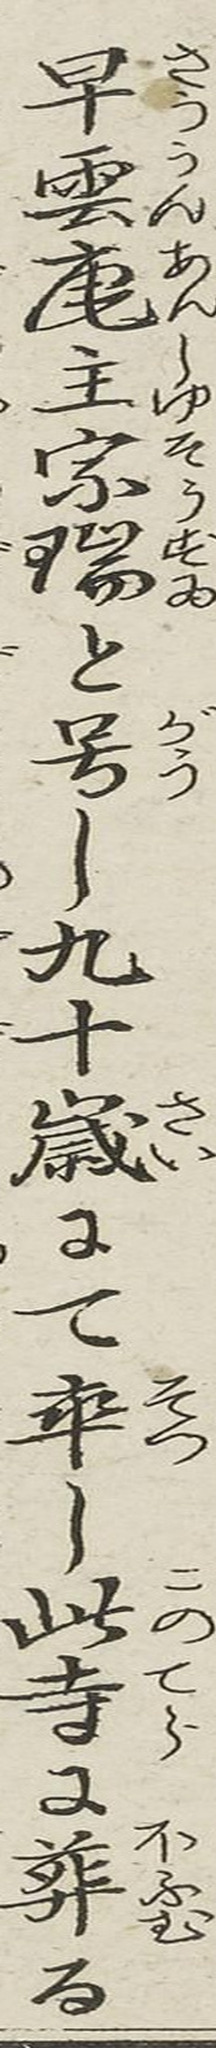早雲庵主宗瑞と号し九十歳にて卒し此寺に葬る
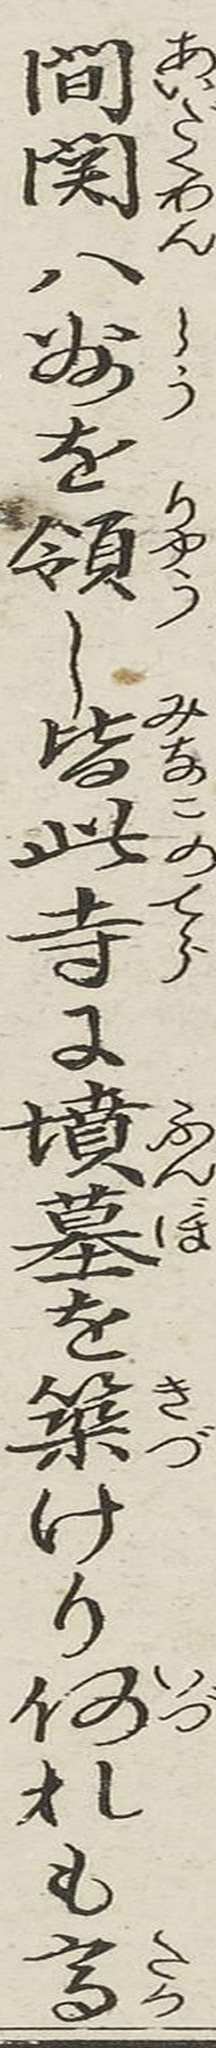間関八州を領し皆此寺に墳墓を築けり何れも高
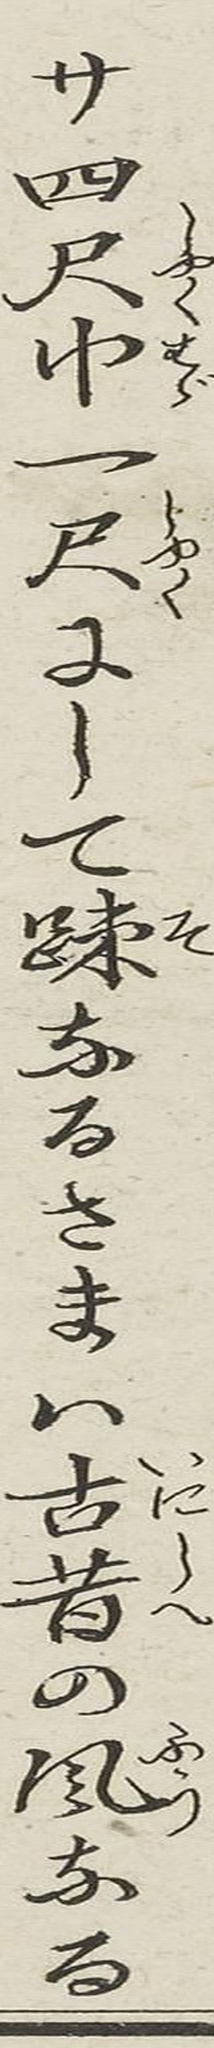サ四尺巾一尺にして疎なるさまは古昔の風なる
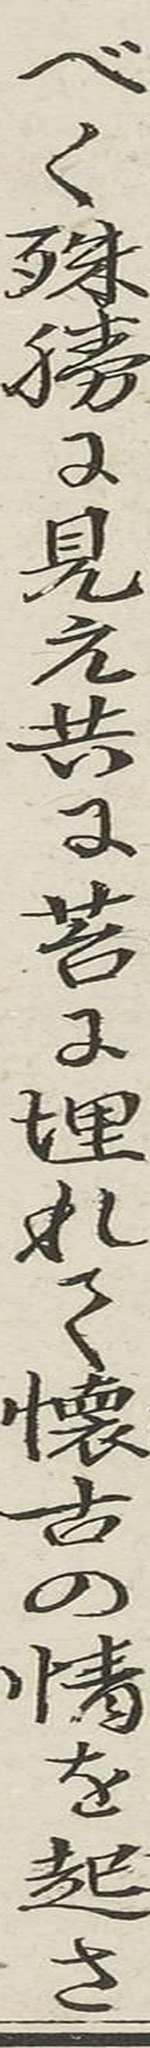べく殊勝に見え共に苔に埋れて懐古の情を起さ
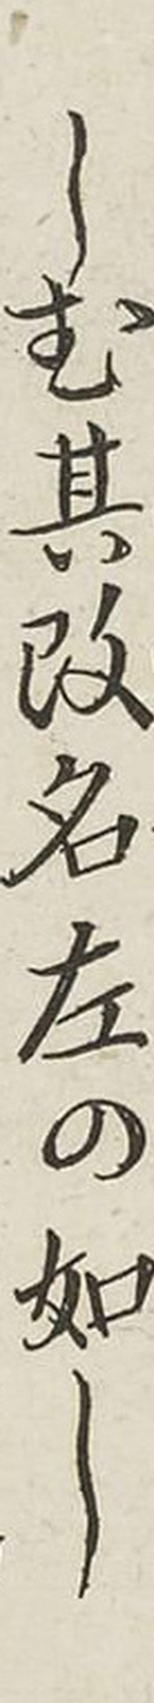しむ其改名左の如し
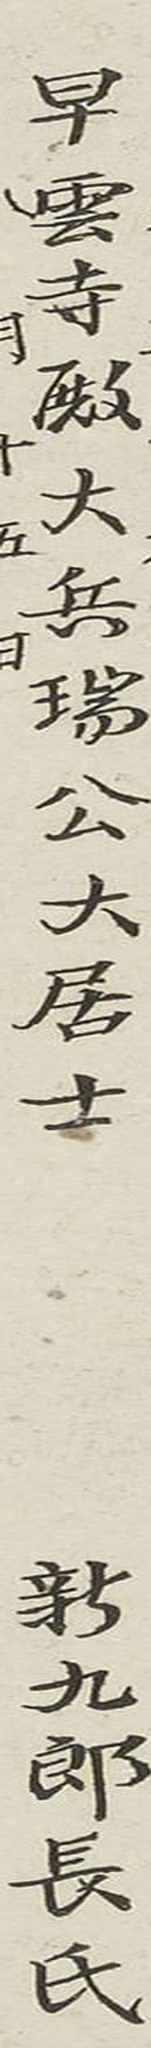早雲寺殿大兵瑞公大居士新九郎長氏
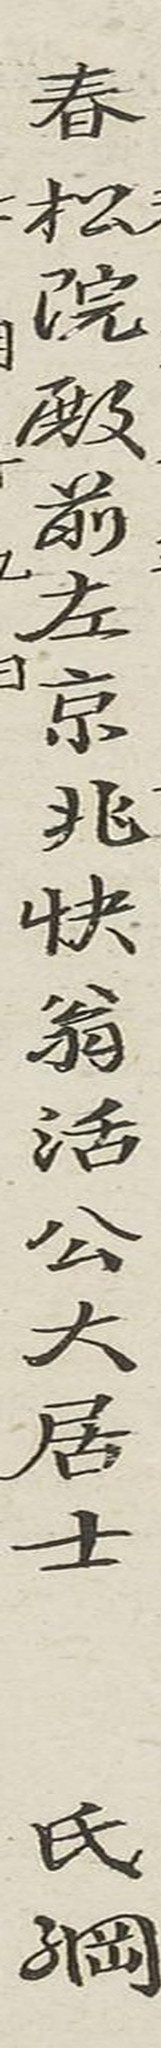春松院殿前左京兆快翁活公大居士氏綱
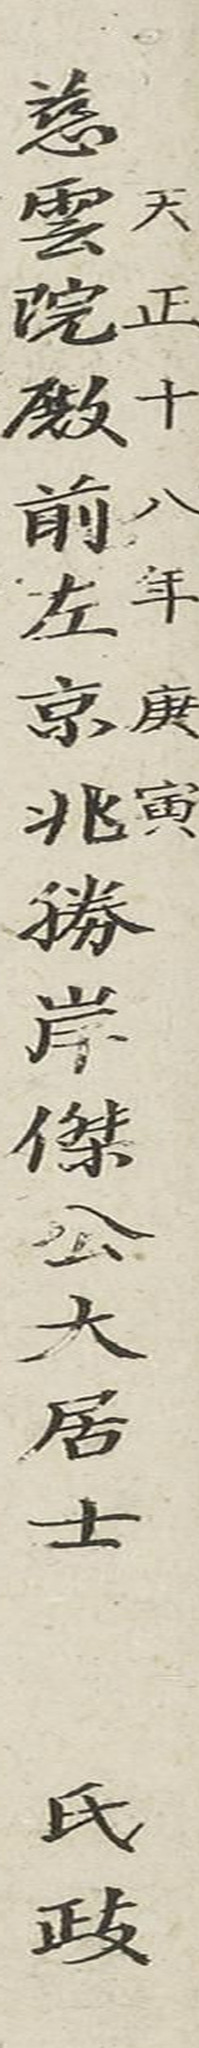慈雲院殿前左京兆勝岸傑公大居士氏政
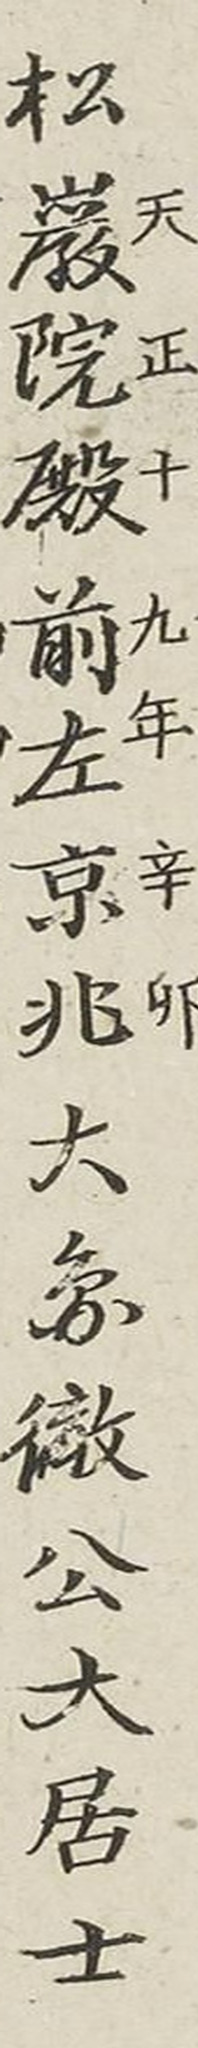松厳院殿前左京兆大象徹公大居士
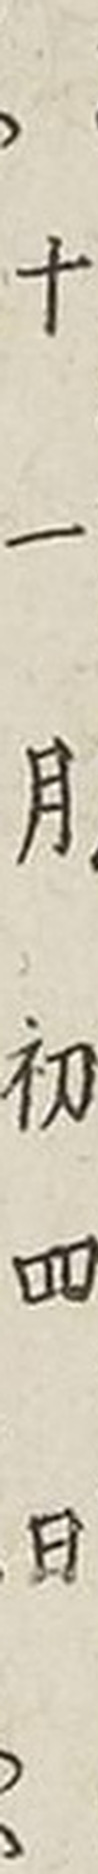十一月初四日
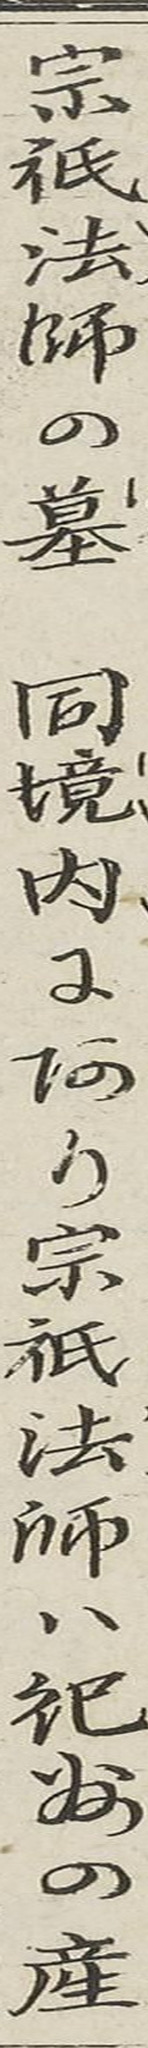宗祇法師の墓同境内にあり宗祇法師は紀州の産
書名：箱根温泉誌　全
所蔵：東京大学地震研究所図書室 Earthquake Research Institute Library, The University of Tokyo, JAPAN
